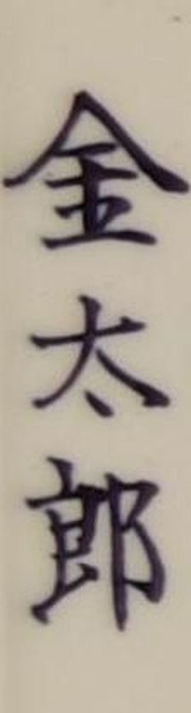金太郎

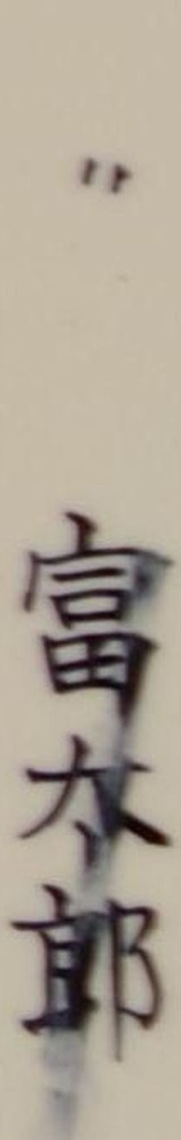富太郎
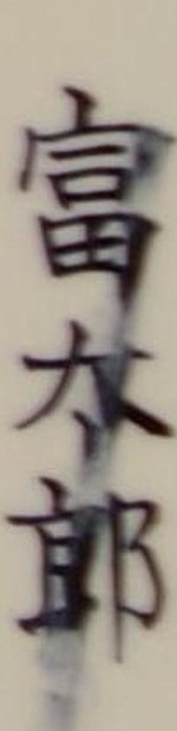富太郎
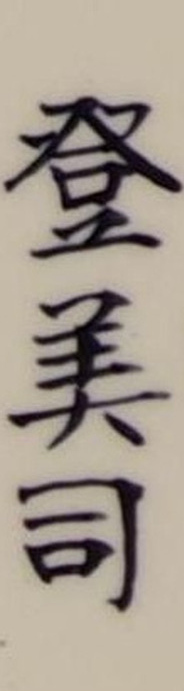登美司

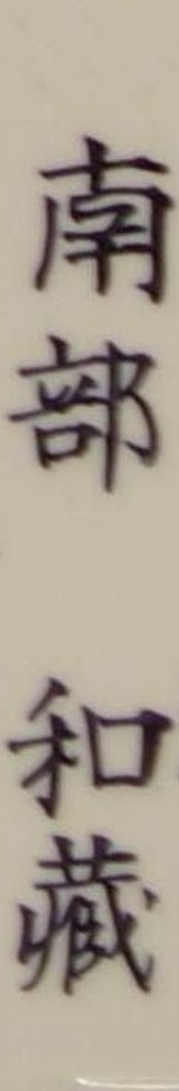南部和蔵
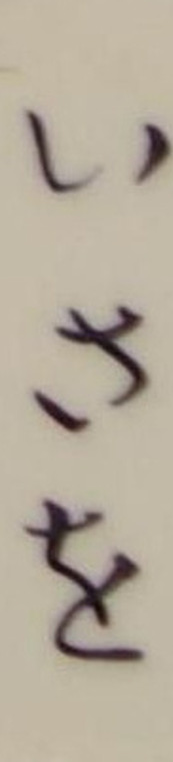いさを
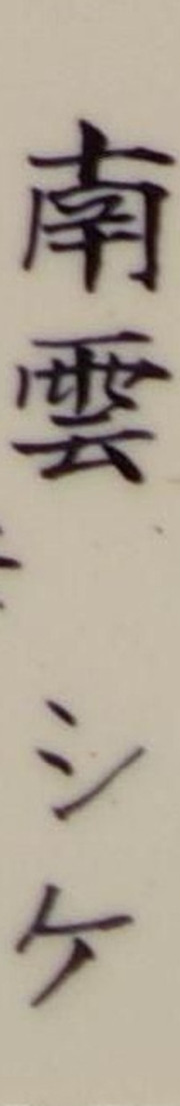南雲シケ
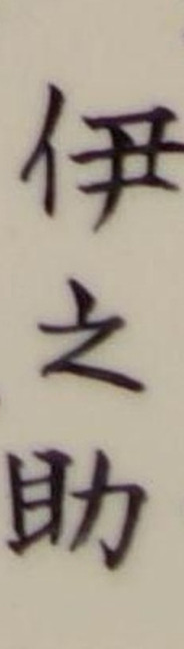伊之助
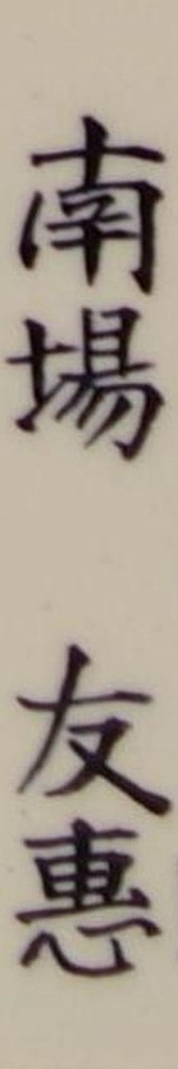南場友恵
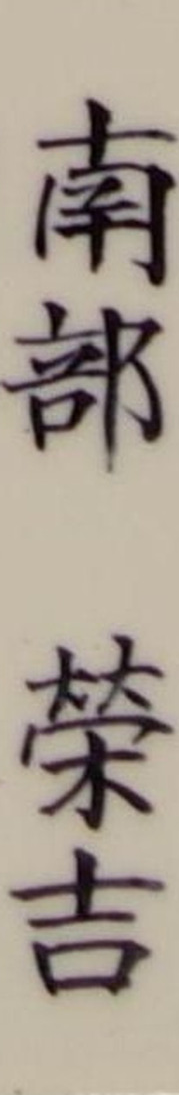南部栄吉
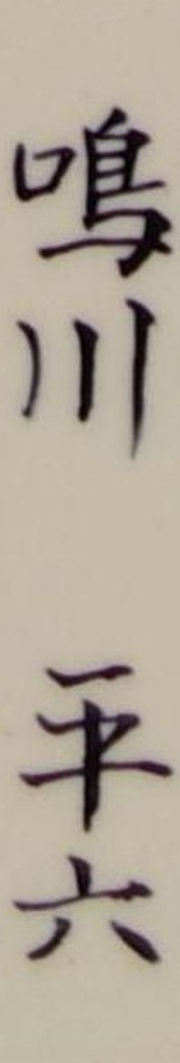鳴川平六
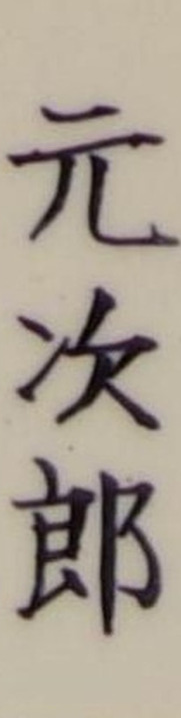元次郎
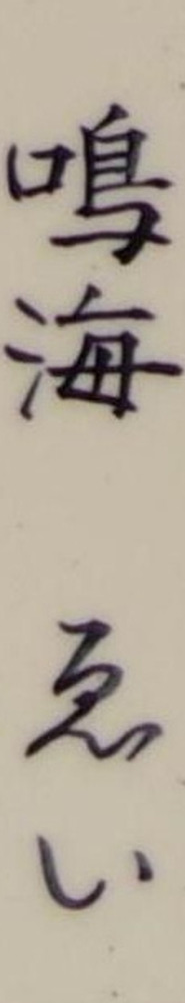鳴海えい
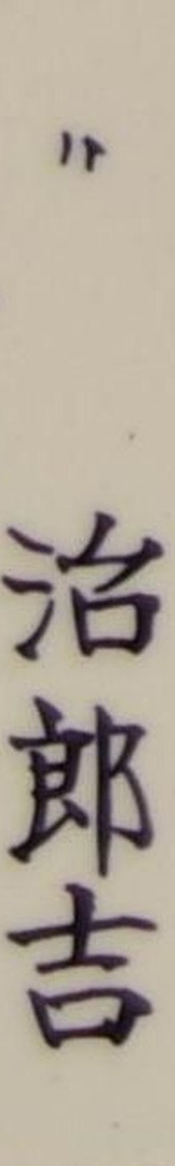治郎吉
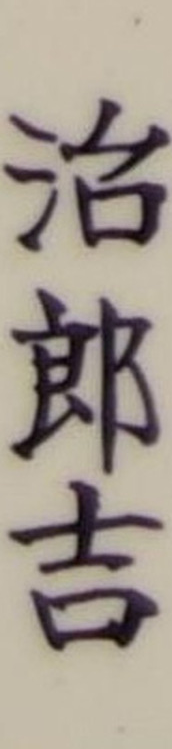治郎吉
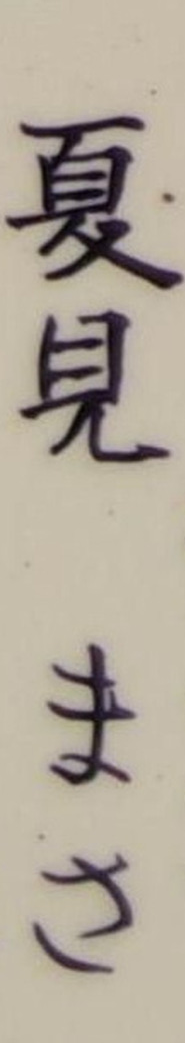夏見まさ
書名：M~S
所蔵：高野山金剛峯寺
